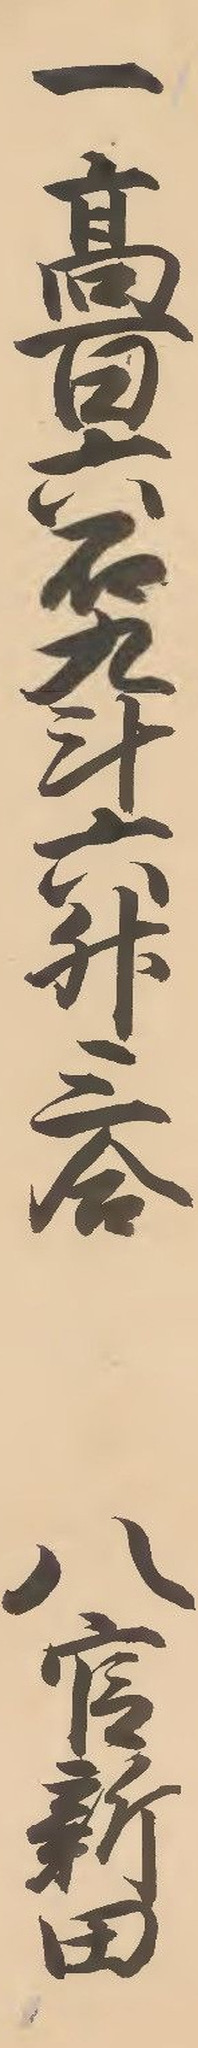一高百六石九斗六升三合八官新田
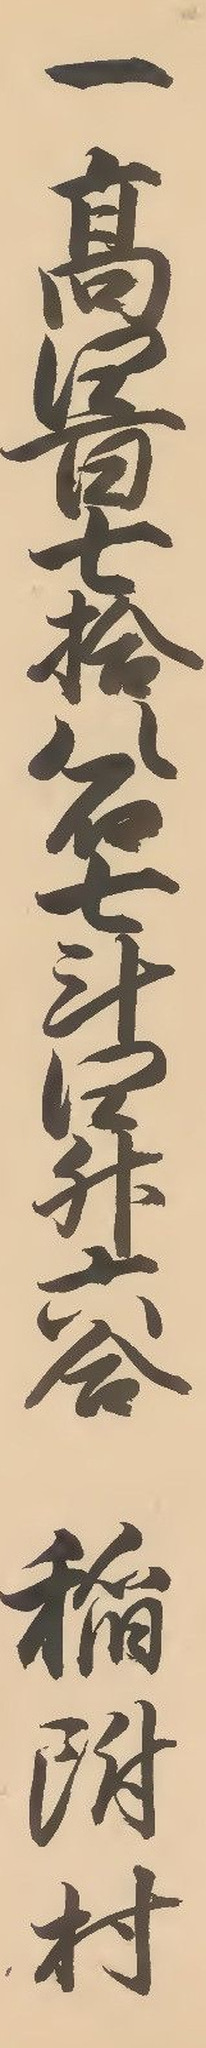一高四百七拾八石七斗四升六合稲附村
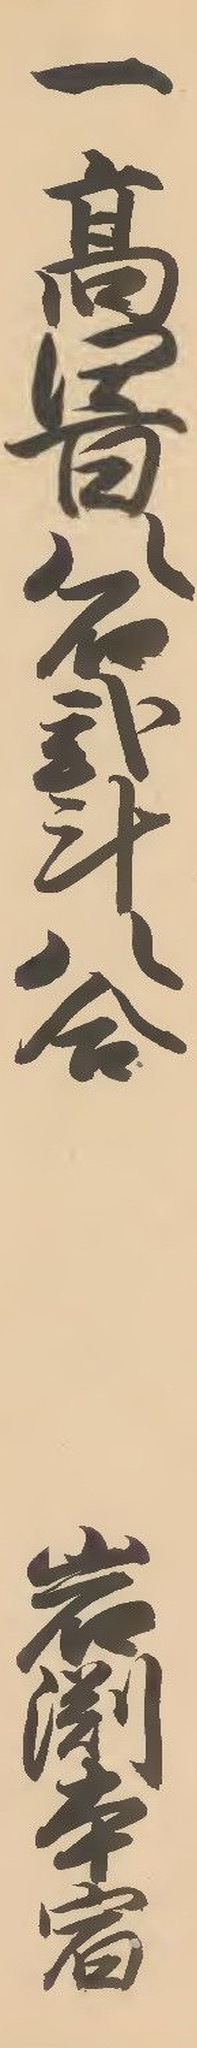一高四百八石弐斗八合岩渕本宿
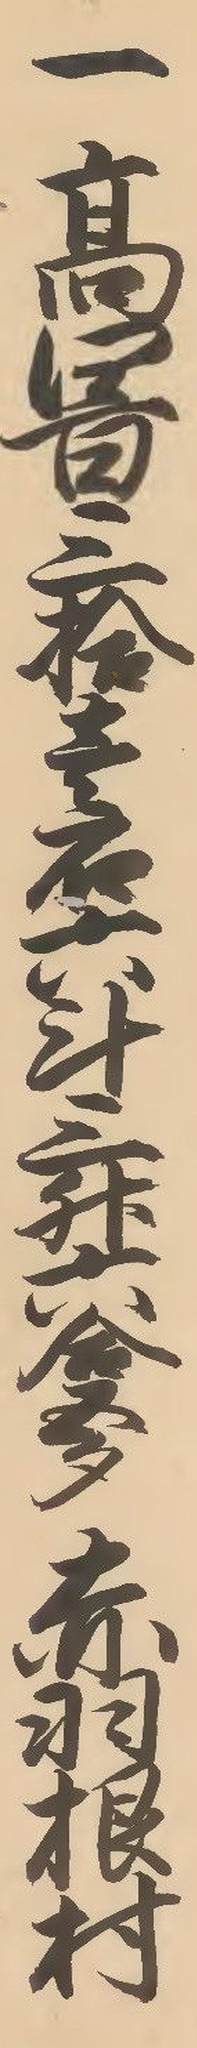一高四百三拾壱石六斗三升六合五勺赤羽根村

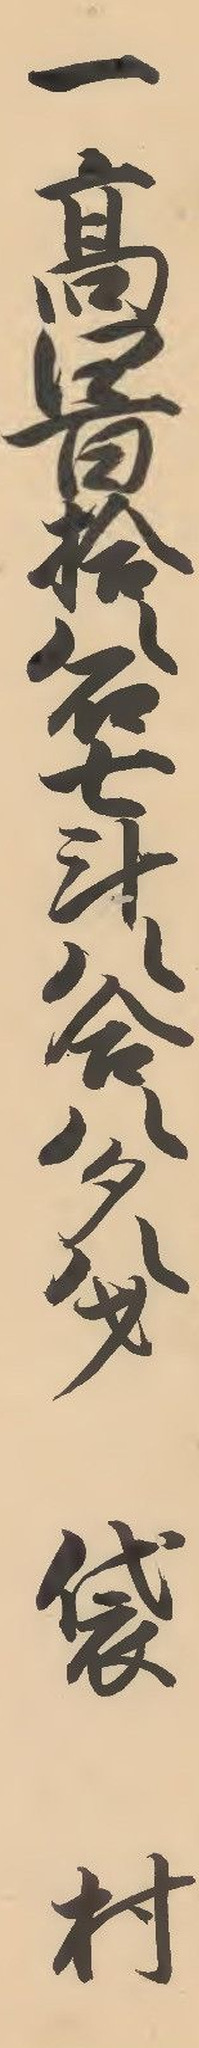一高四百拾八石七斗八合八勺八才袋村
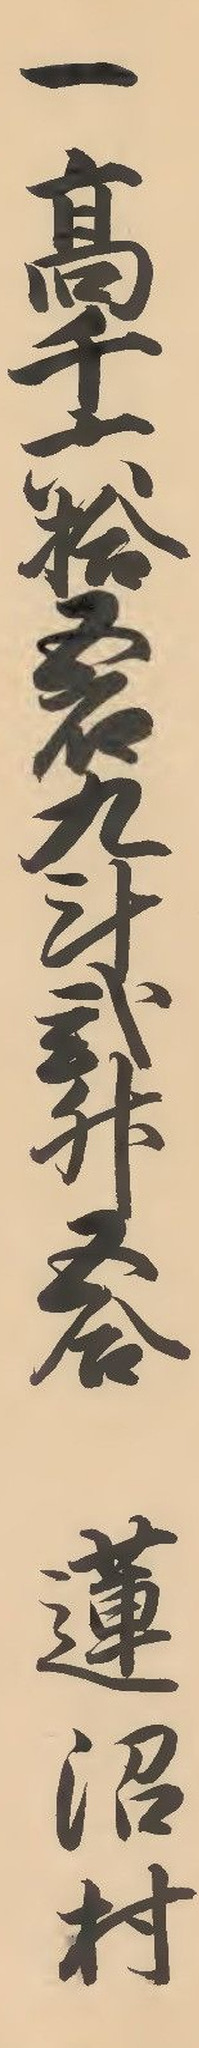一高千六拾五石九斗弐升五合蓮沼村
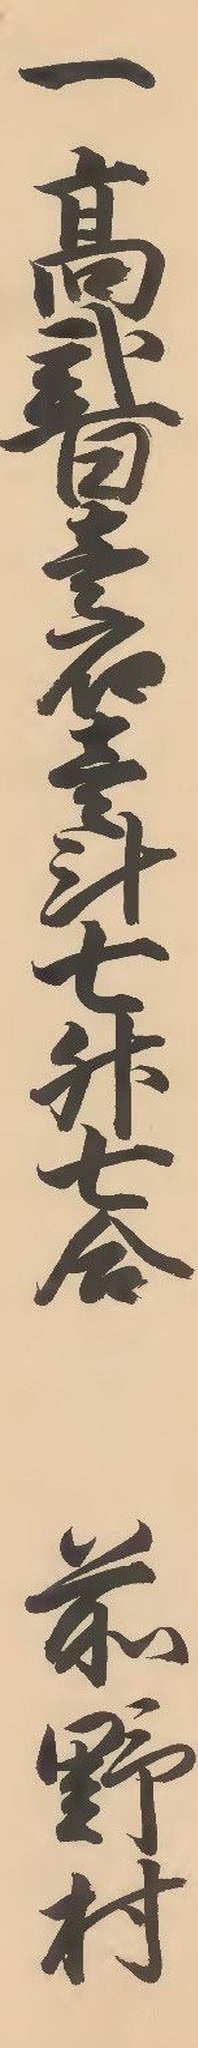一高弐百壱石壱斗七升七合前野村
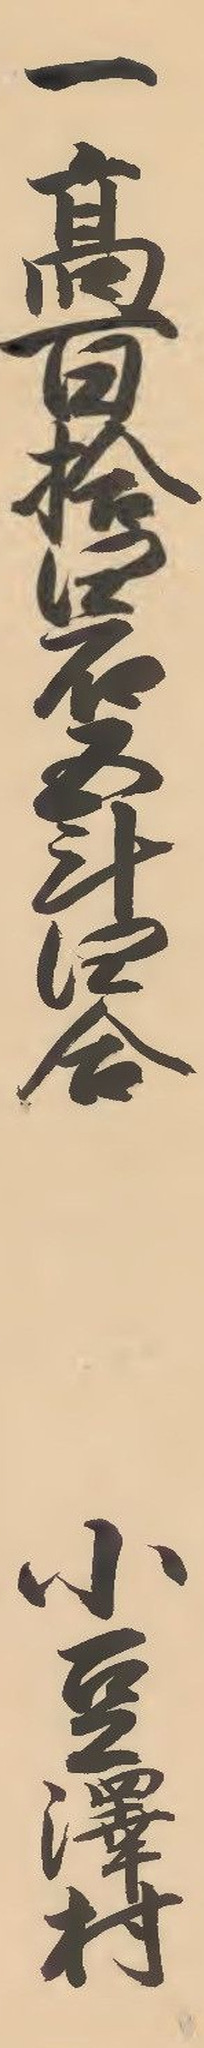一高百拾四石五斗四合小豆澤村
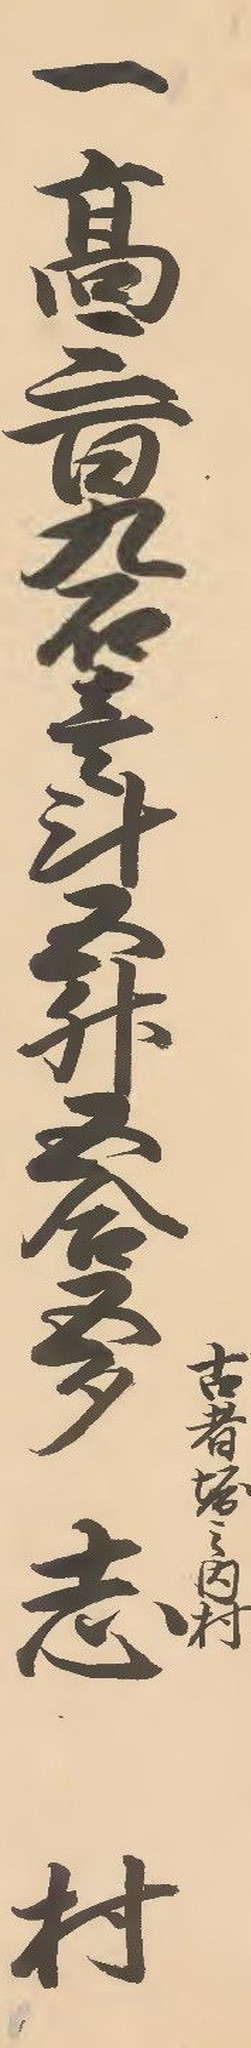一高三百九石壱斗五升五合五勺志村
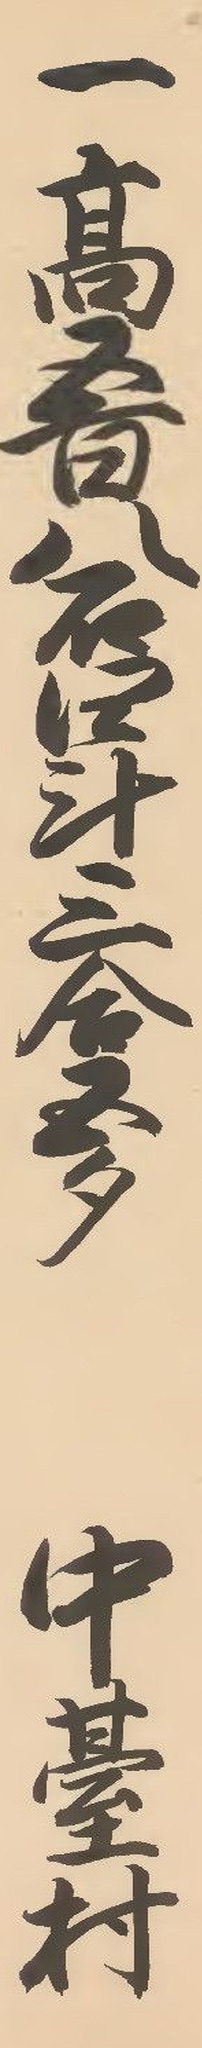一高五百八石四斗三合五勺中台村
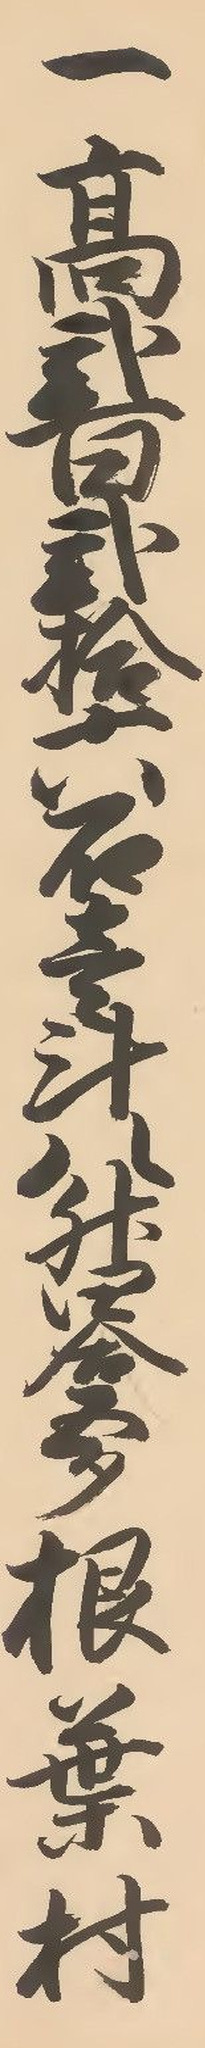一高弐百弐拾六石壱斗八升四合五勺根葉村
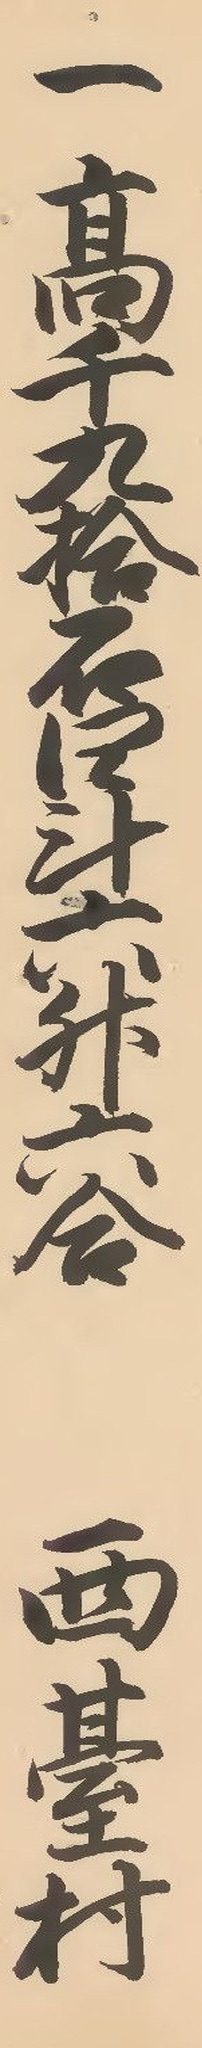一高千九拾石四斗六升六合西台村

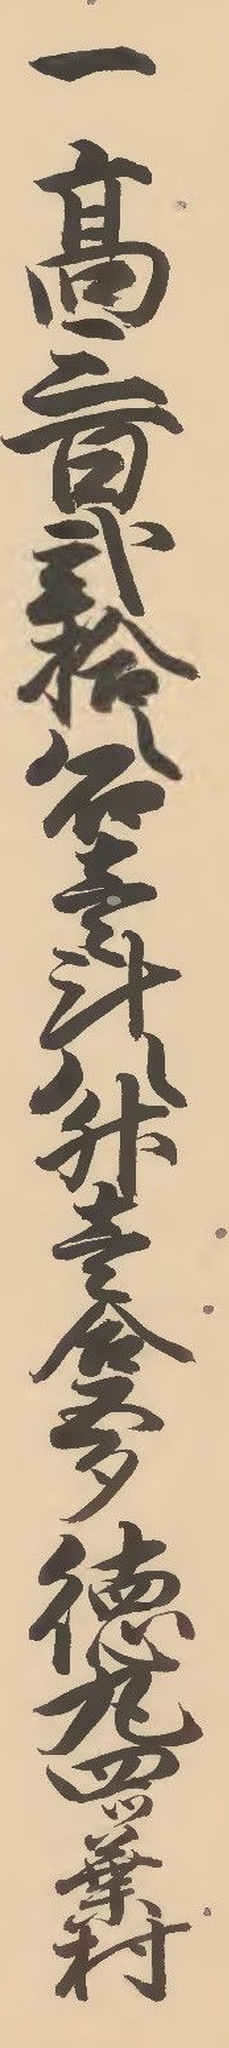一高三百弐拾八石壱斗八升壱合五勺徳丸四葉ッ村
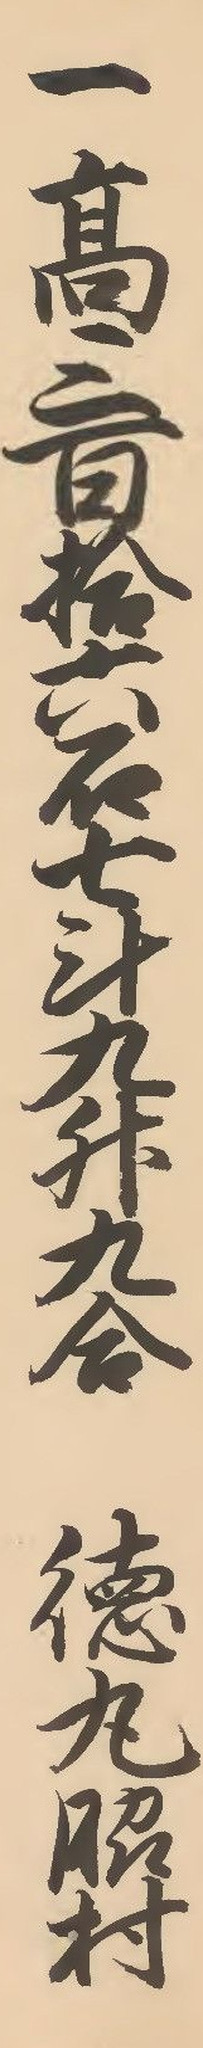一高三百拾六石七斗九升九合徳丸脇村
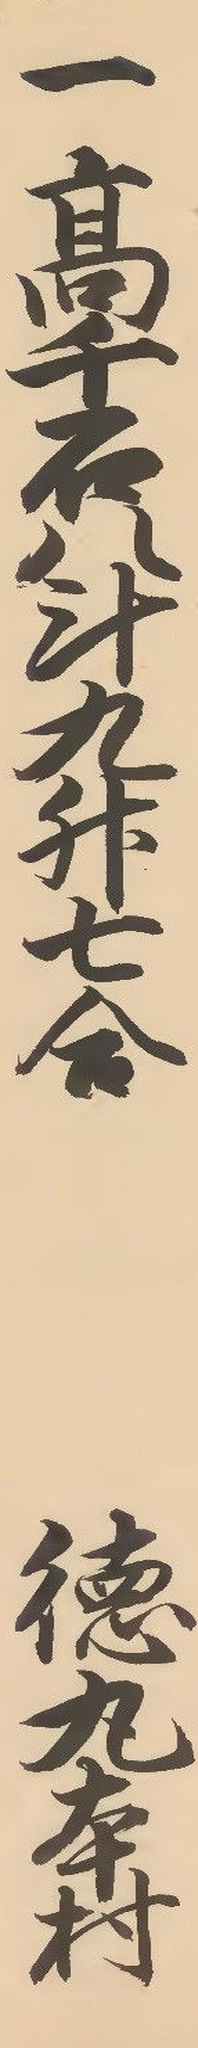一高千石八斗九升七合徳丸本村
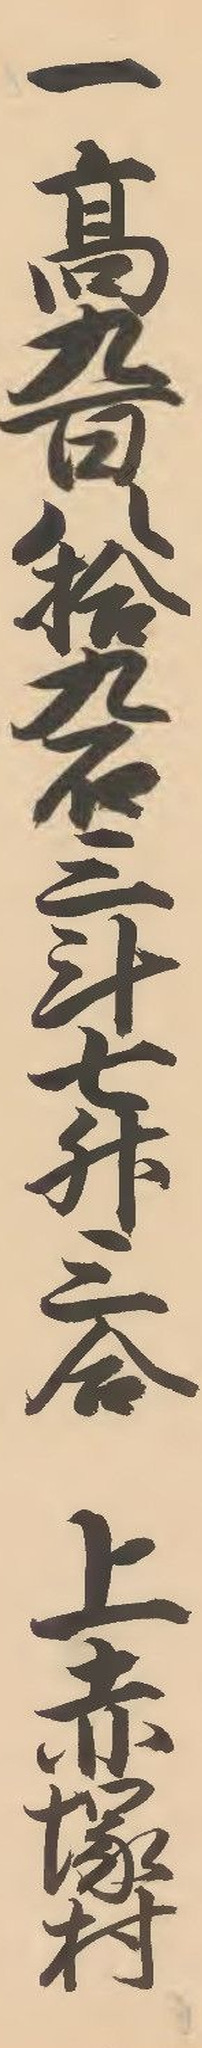一高九百八拾九石三斗七升三合上赤塚村
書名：武蔵国郷帳　上
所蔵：国立公文書館 National Archives of Japan
